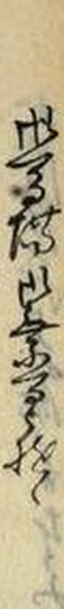御馬場御乗馬被遊候
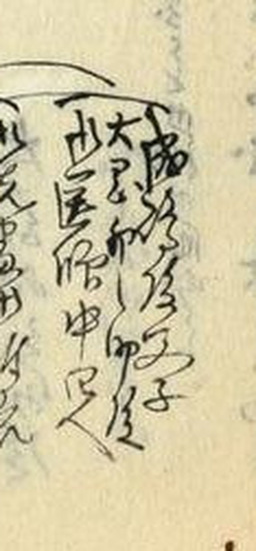大岡卯之助殿
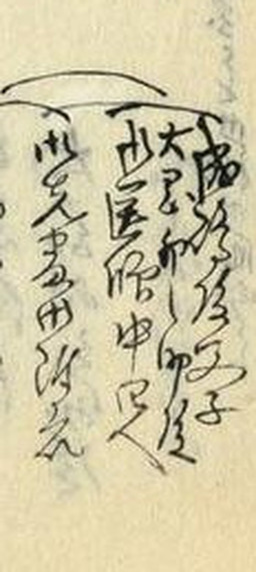御医師中四人
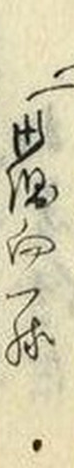御側向一縁
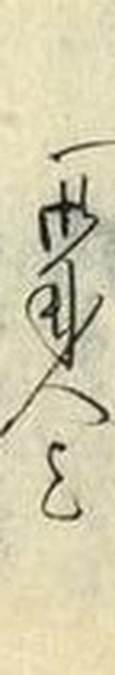御用人迄
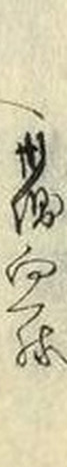御側向一縁
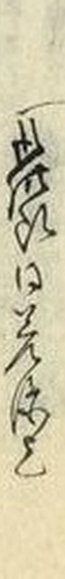御供頭同差添迄
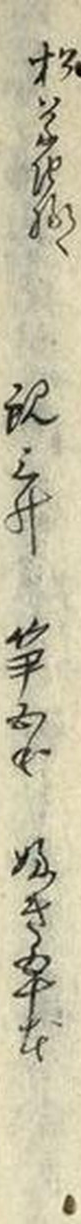松栄院様へ蜆三升笋五本ふき五十本
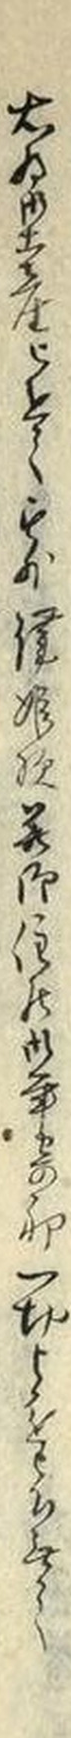右為御土産被進之其外謹姫様幷御住居御年寄初一切被進被下無之
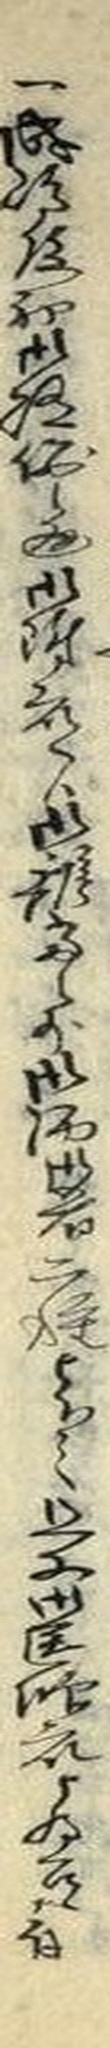一成嶋殿初御賄例之通御附衆ヘハ御弁当之外御酒御肴二種被下之且又御医師衆被為召候ニ付

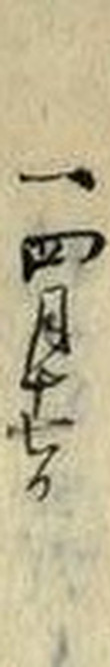一四月十八日
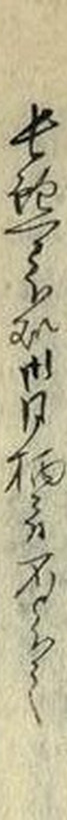長鮑可被下処御日柄ニ付不被下之
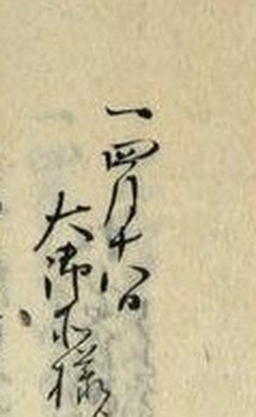一四月十八日
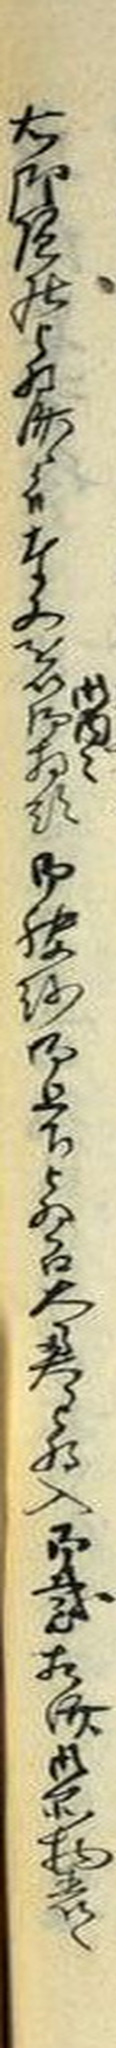右御隠居被為済候ニ付奉文を以御内々御拝領御服紗御上下被為召大奥へ被為入御頂戴相済御品物表へ
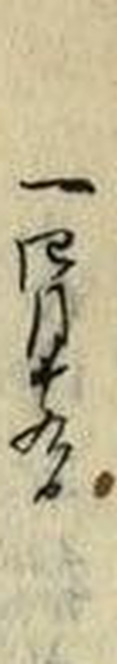一四月十八日
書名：少傅日録抄（斉善付側向頭取日記、在府）
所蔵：福井県文書館 Fukui Prefectural Archives
